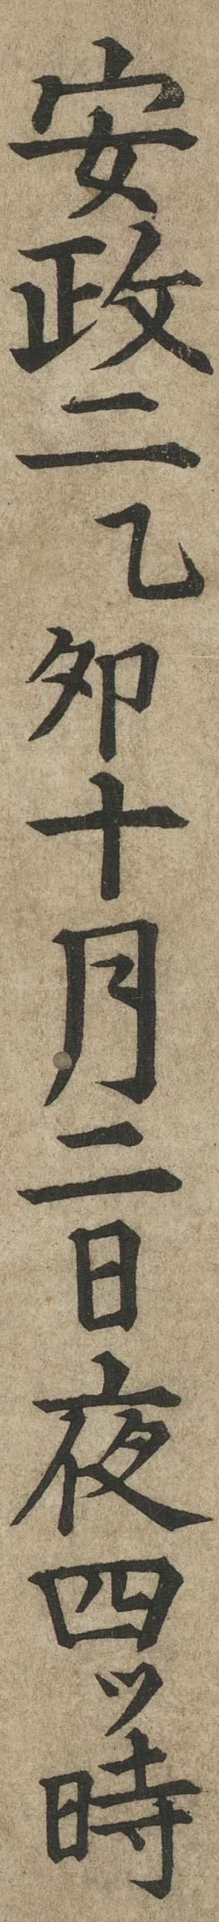安政二乙卯十月二日夜四ツ時
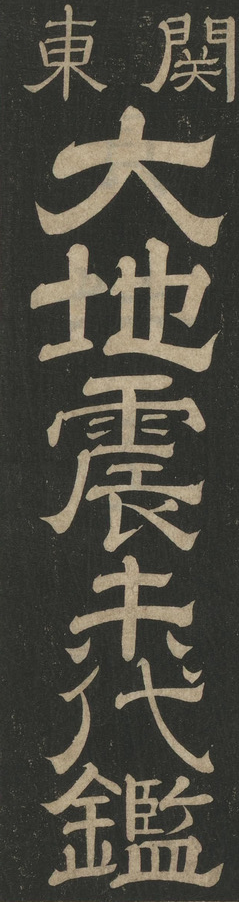関東大地震未代鑑

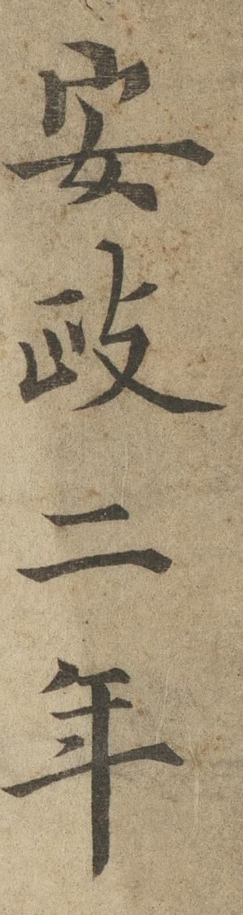安政二年
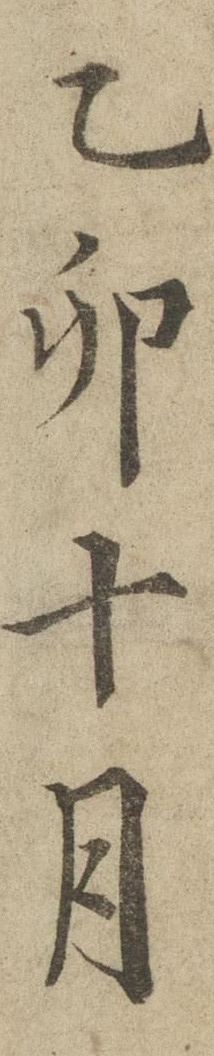乙卯十月
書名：関東大地震未代鑑
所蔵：東京大学地震研究所図書室 Earthquake Research Institute Library, The University of Tokyo, JAPAN
